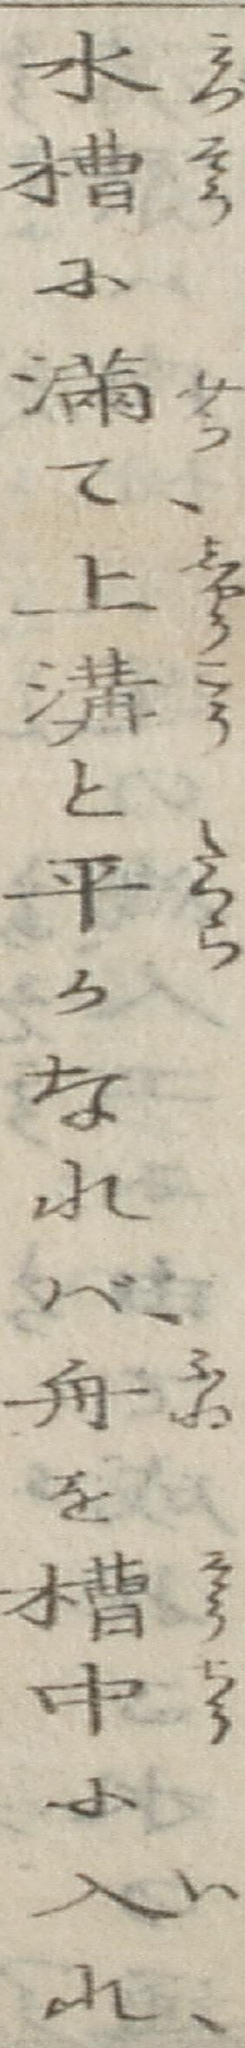水槽に満て、上溝と平かなれば、舟を槽中に入れ、
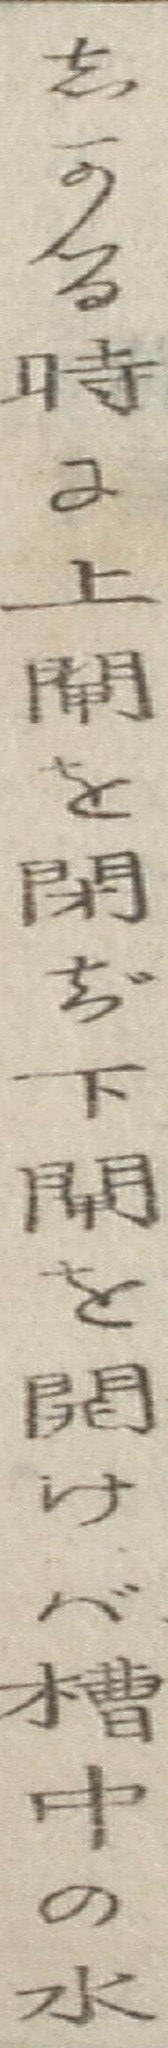しかる時に上閘をを閉ぢ下閘を開けば、槽中の水
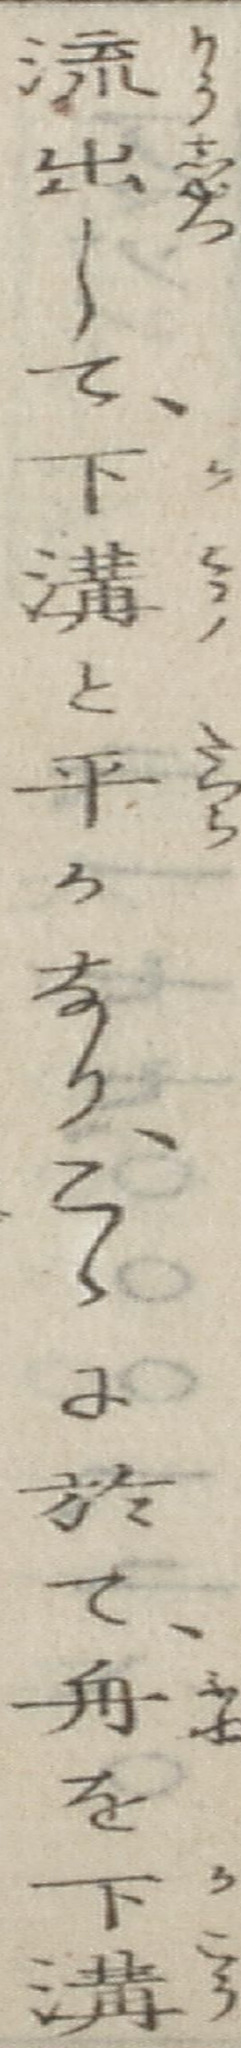流出して、下溝と平かなり、こゝに於て、舟を下溝
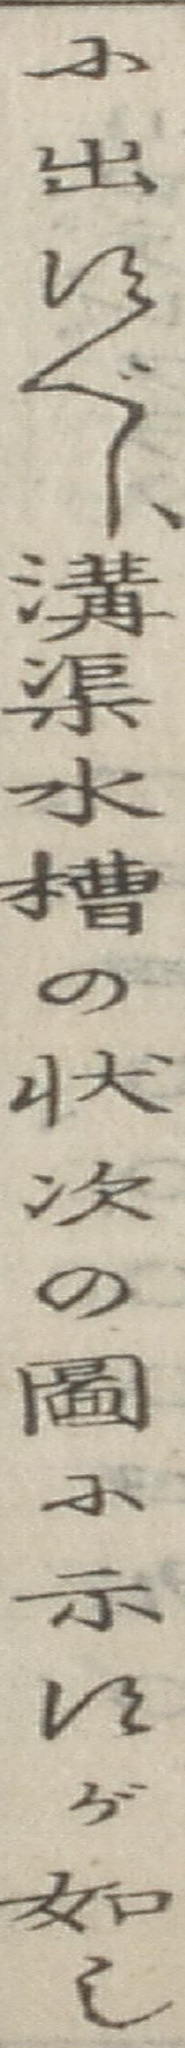に出すべし、溝渠水槽の状次の図に示すが如し

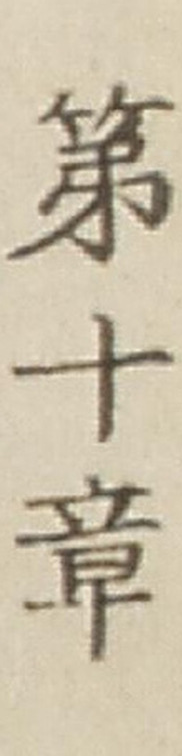第十章
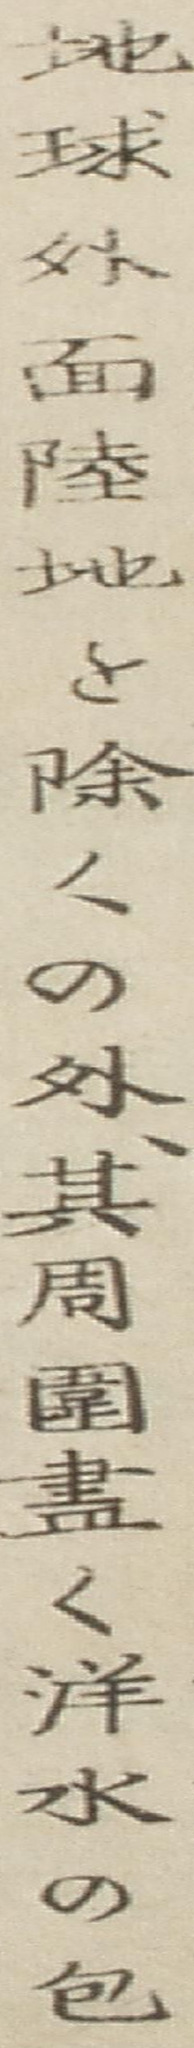地球外面陸地を除くの外、其周囲盡く洋水の包
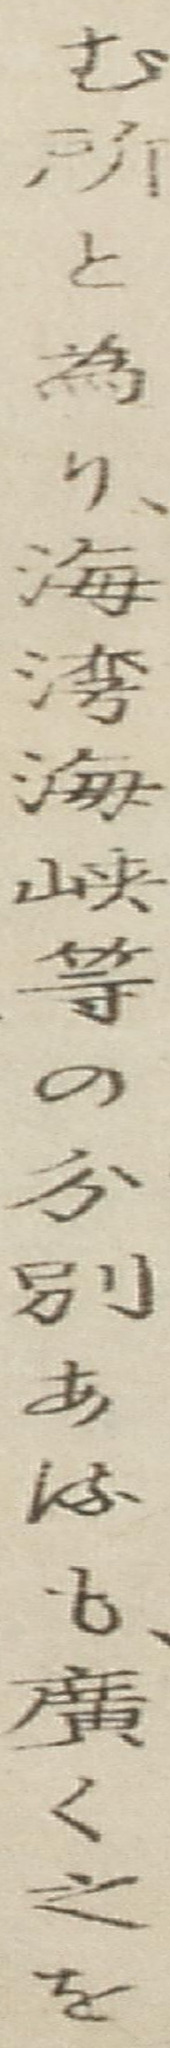む所と為り、海湾海峡等の分別あるも、広く之を
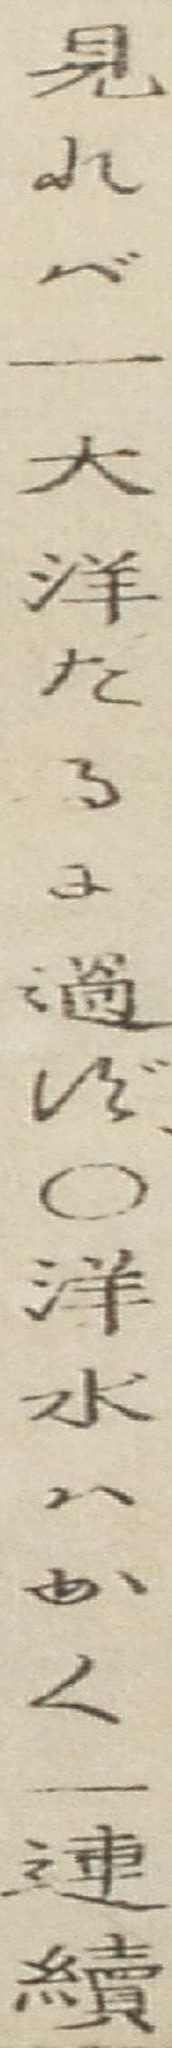見れば一大洋たるに過ず、〇洋水はかく一連続
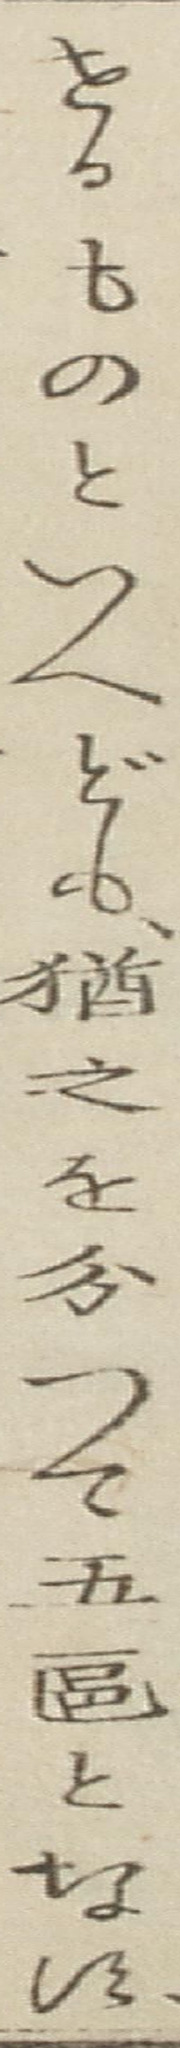せるものといへども、猶之を分つて五区となす、
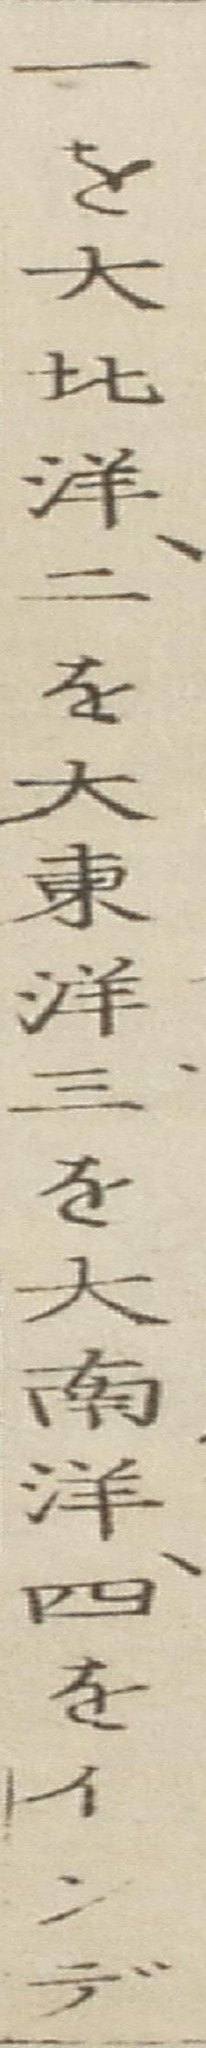一を大北洋、二を大東洋、三を大南洋、四をインデ
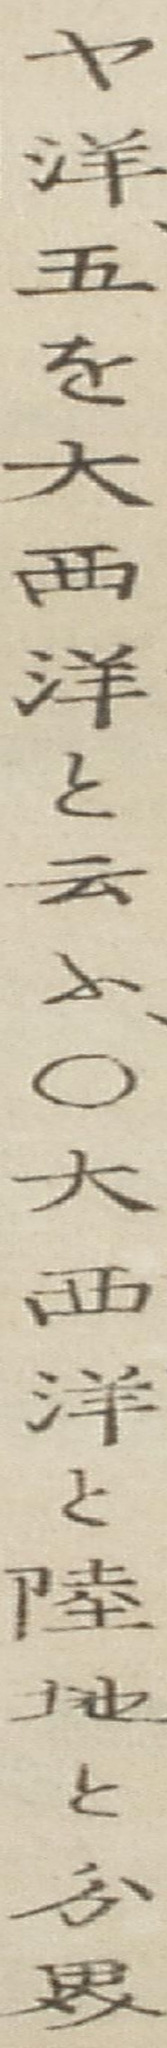ヤ洋、五を大西洋と云ふ、〇大西洋と陸地と分界
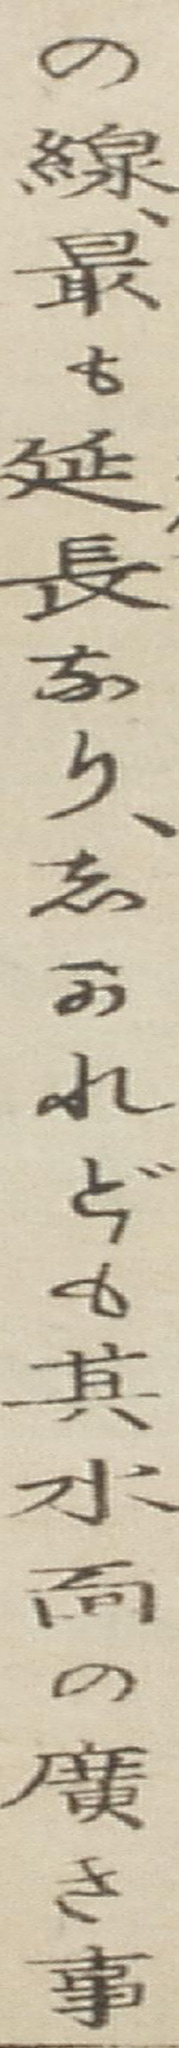の線、最も延長なり、しかれども其水面の広き事
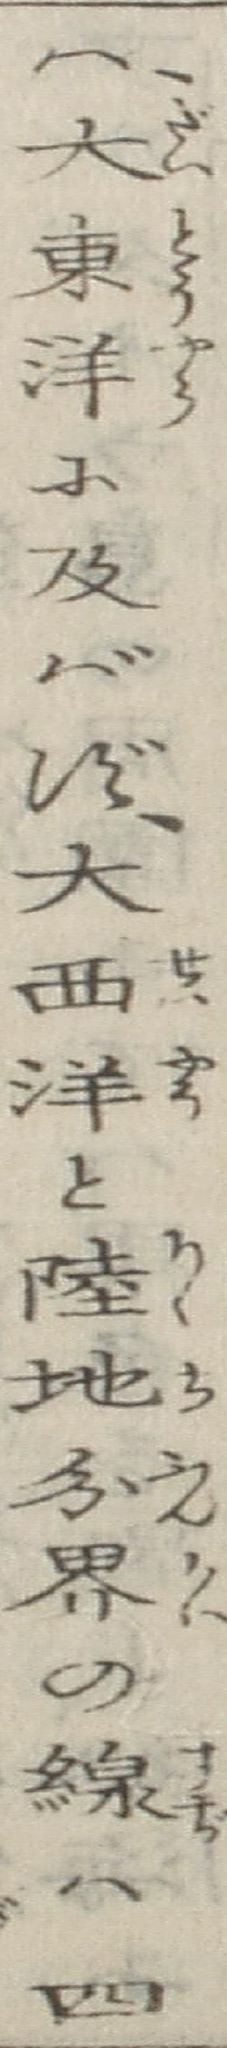は、大東洋に及ばず、大西洋と陸地分界の線は四
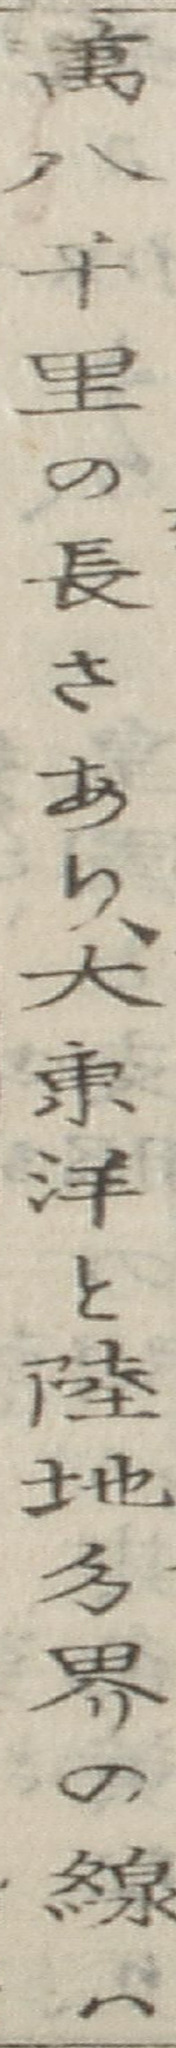萬八千里の長さあり、大東洋と陸地分界の線は
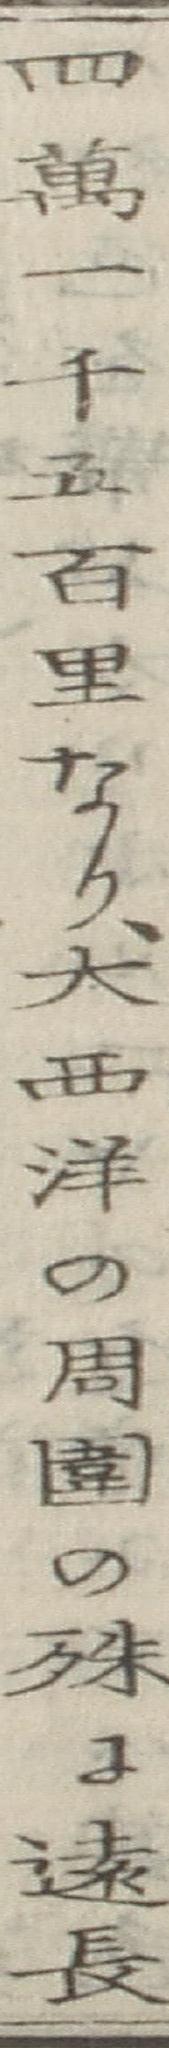四萬一千五百里なり、大西洋の周囲の殊に遠長
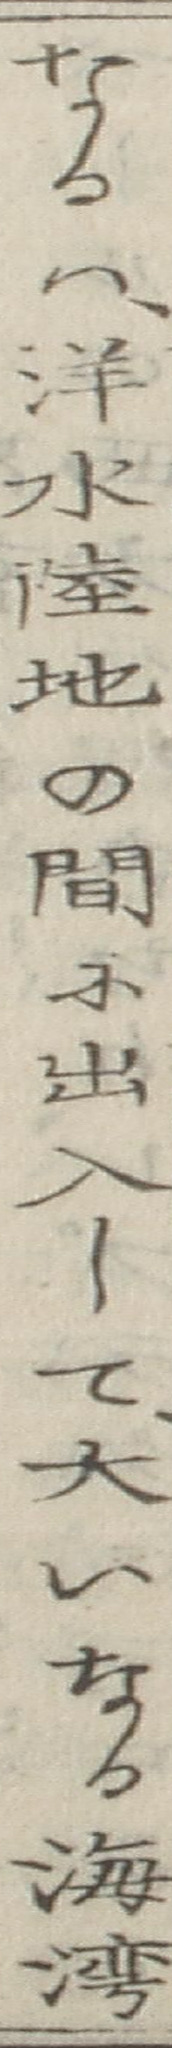なるは、洋水陸地の間に出入して、大いなる海湾
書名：訓蒙　天然地理學　中
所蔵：東京大学地震研究所図書室 Earthquake Research Institute Library, The University of Tokyo, JAPAN
